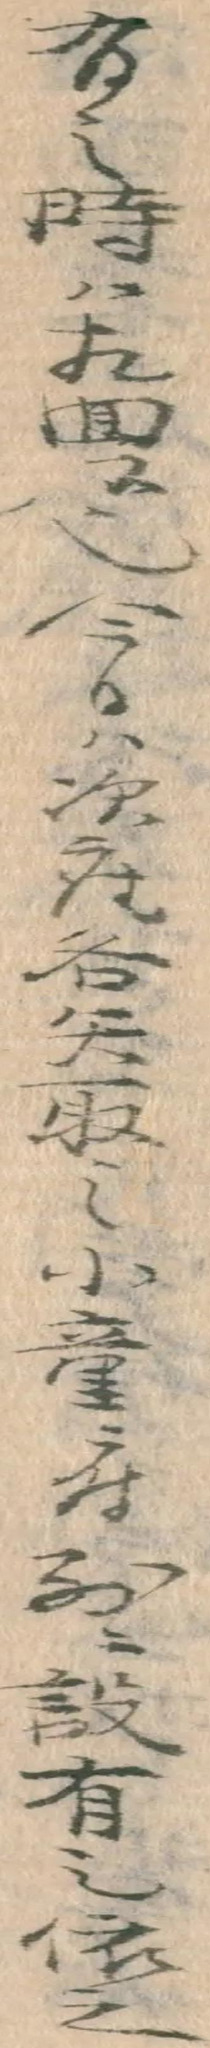有之時ハ相面ス也今日ハ次座各矢取之小童ニ付別ニ設有之依之
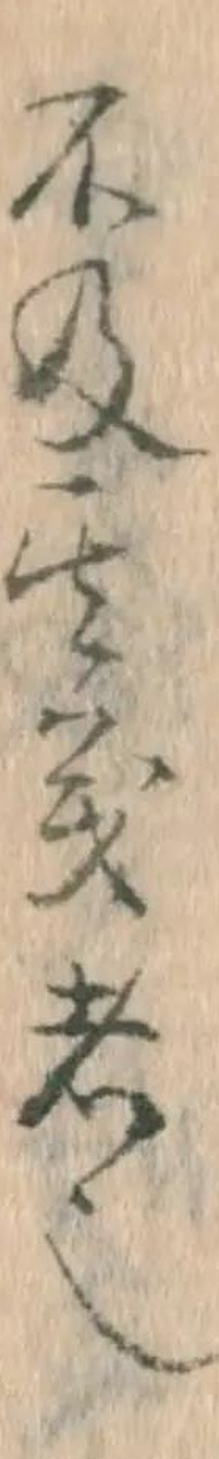不及其義者也
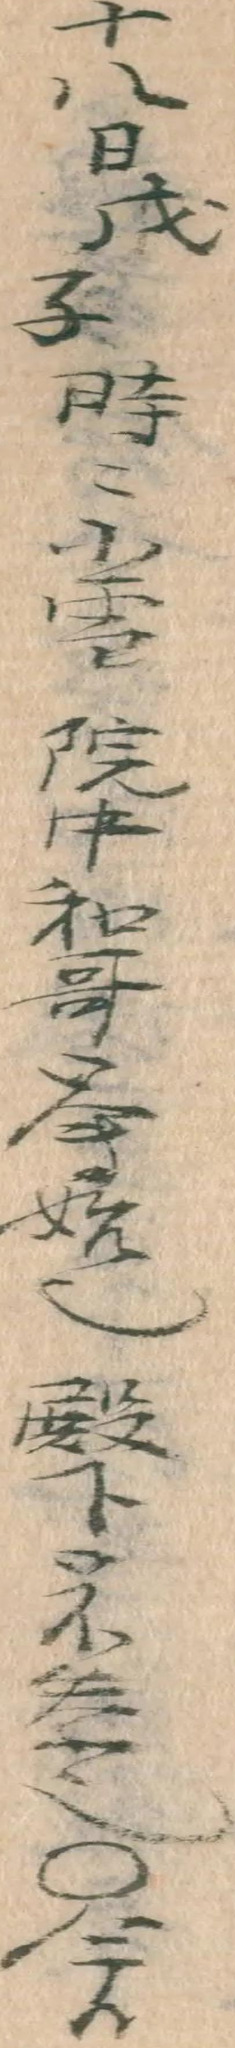十八日戊子時ニ小雪院中和歌御会始也殿下御不参也〇今日
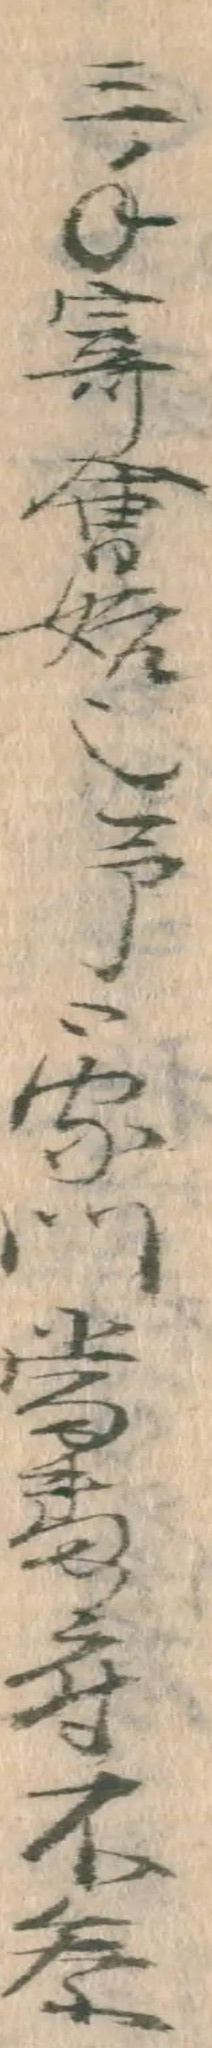三年寄会始也予御家門当番ニ付不参
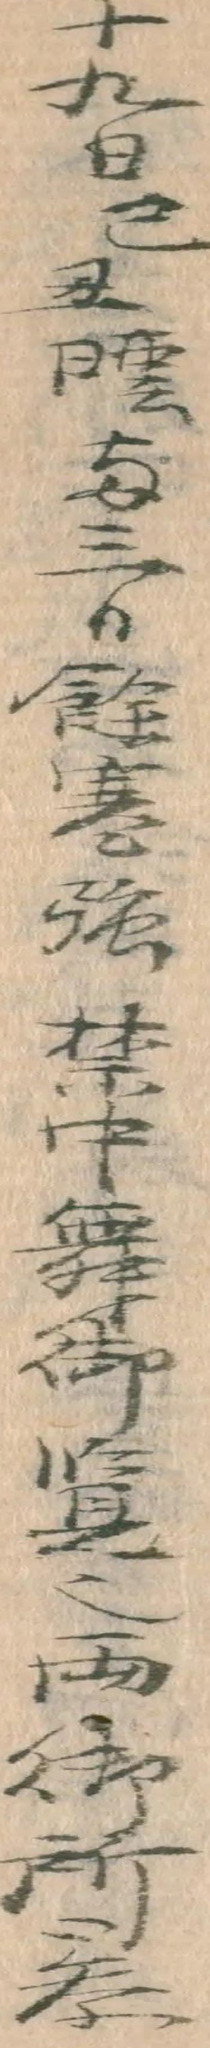十九日己丑曇両三日余寒強禁中舞御覧也両御所御参
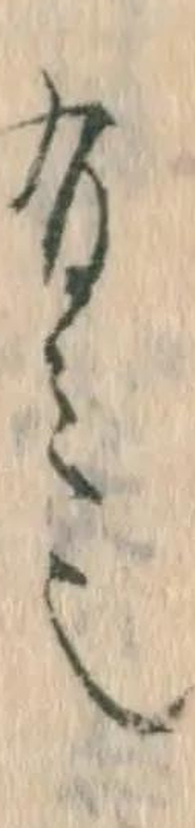有之也
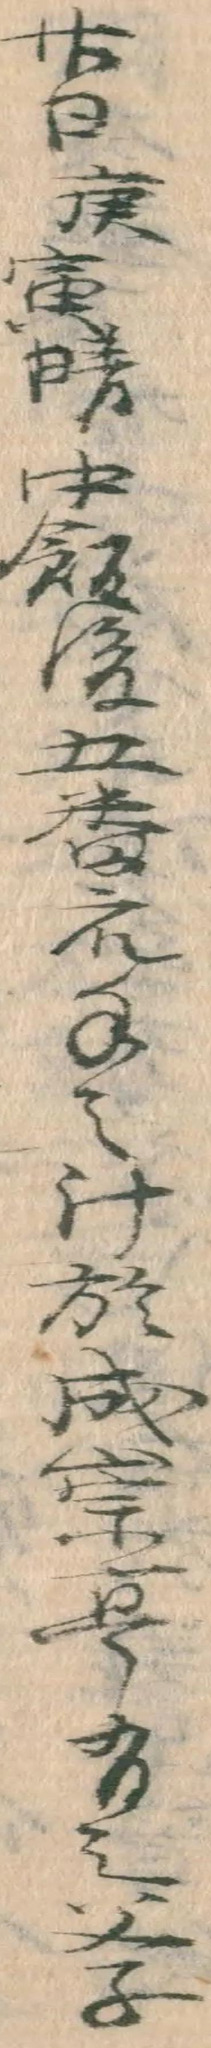廿日庚寅晴中飯後五番衆年之汁於成崇亭有之父子
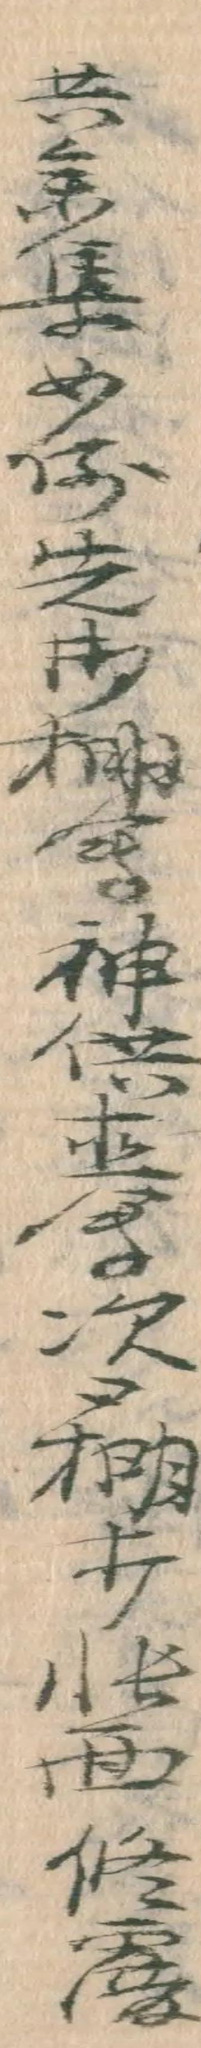共参集如例先御棚会神供直会次ニ棚打帳面修覆
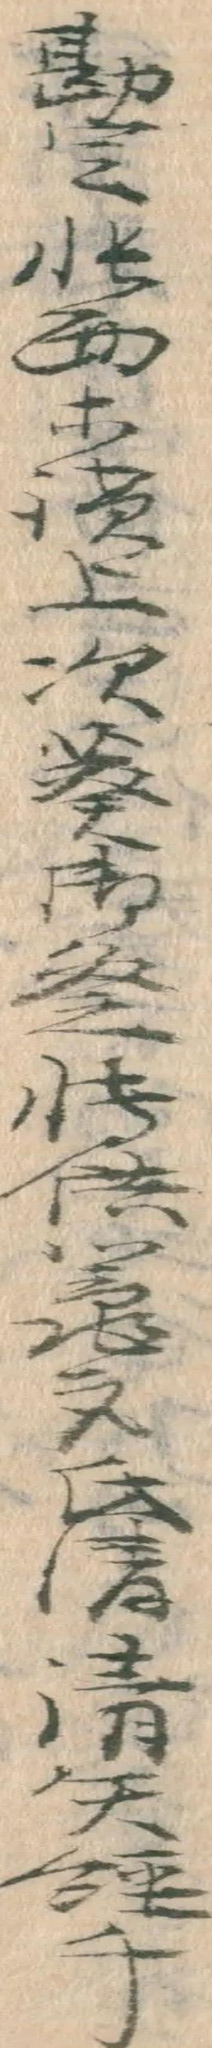勘定帳面等積上次葵御祭転供鬮取氏清清矢経千
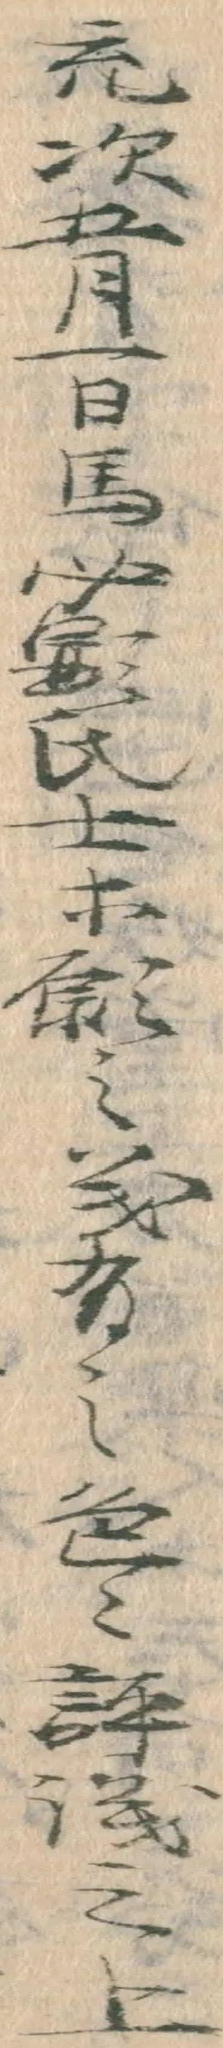充次五月一日馬必顕氏士等願之義有之色々評議之上
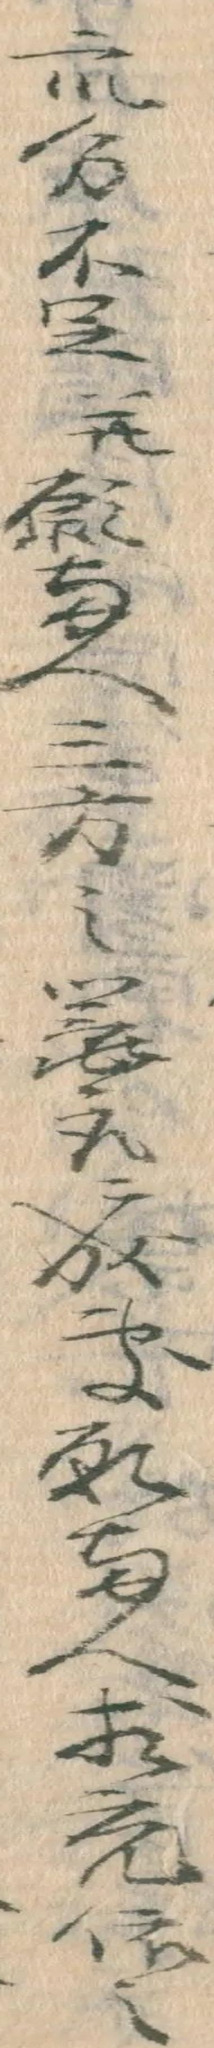衆分不足并願両人三方之鬮取ニ成処願両人相充依之
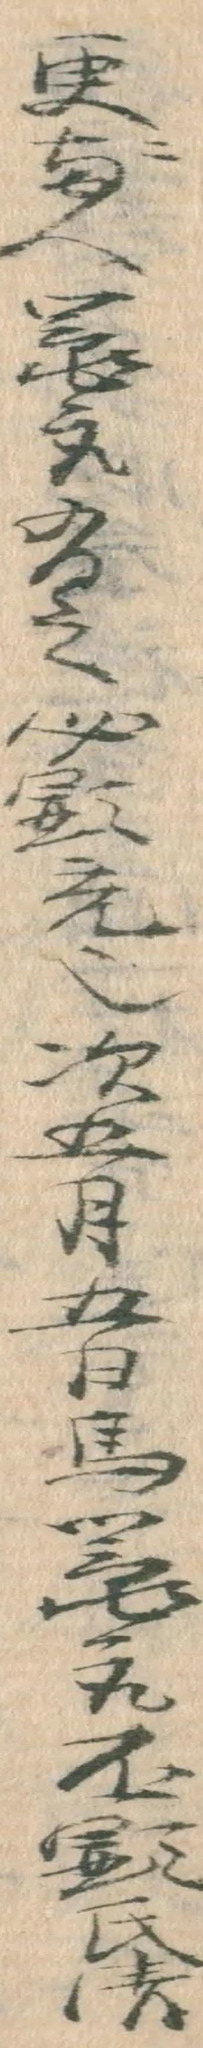更ニ両人鬮取有之必顕充也次五月五日馬鬮取丞顕氏清
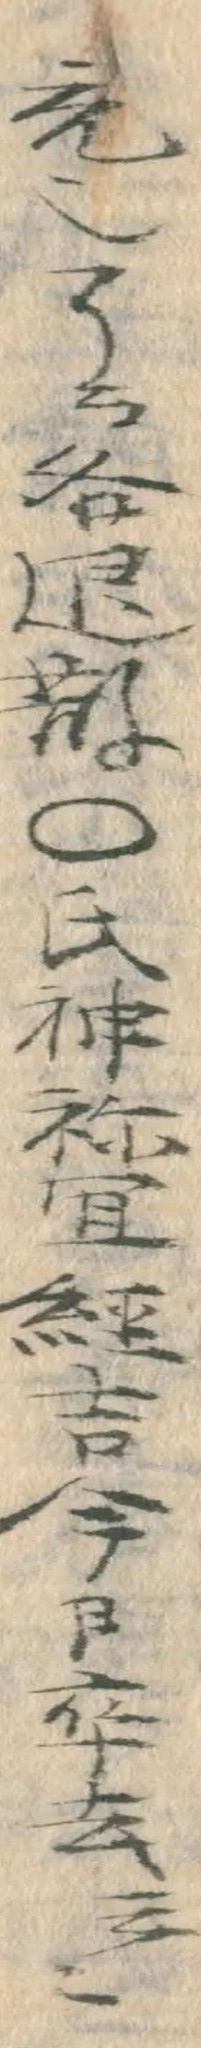充也了而各退散○氏神祢宜経吉今日卒去云々
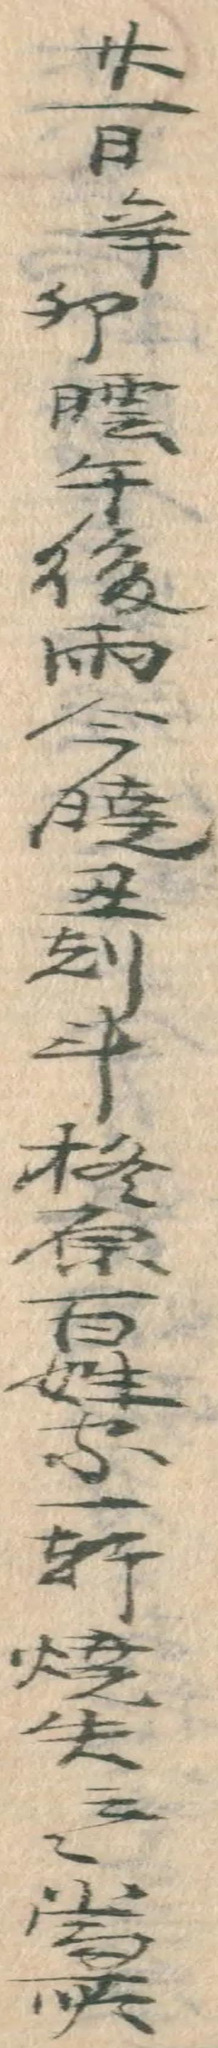廿一日辛卯曇午後雨今暁丑刻斗柊原百姓家一軒焼失云々当所
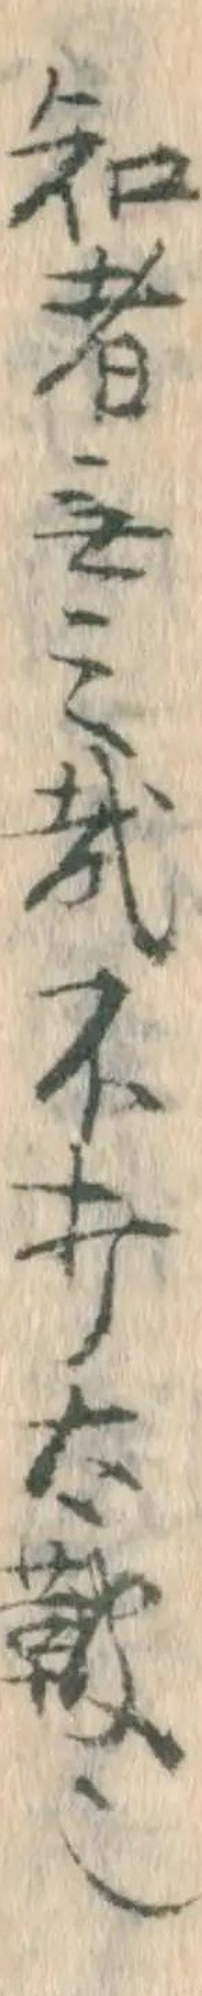知者無之哉不打太鼓也
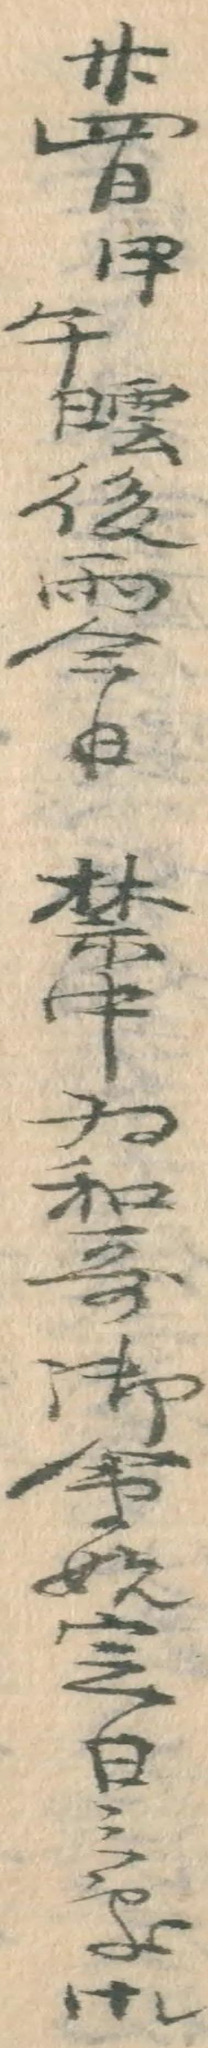廿四日甲午曇後雨今日禁中為和歌御会始定日之処御
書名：賀茂社記録. 第64冊
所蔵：国立国会図書館 National Diet Library, JAPAN
